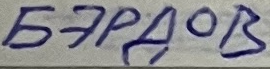бэрдов
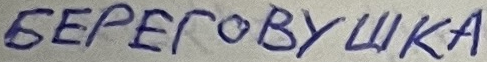береговушка
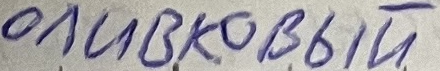оливковый
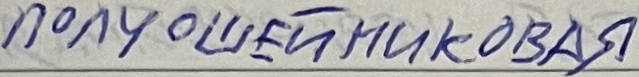полуошейниковая
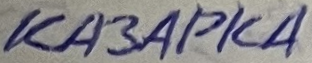казарка
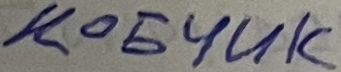кобчик
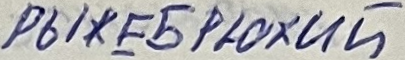рыжебрюхий
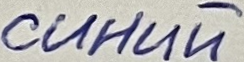синий
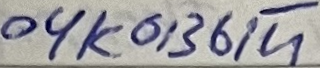очковый
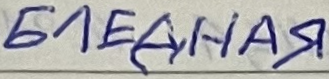бледная
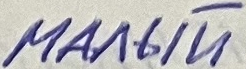малый
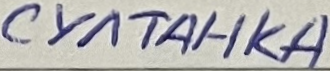султанка
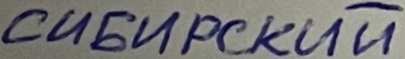сибирский
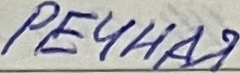речная
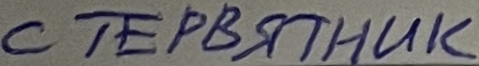стервятник
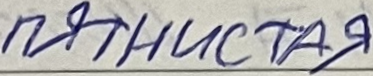пятнистая
